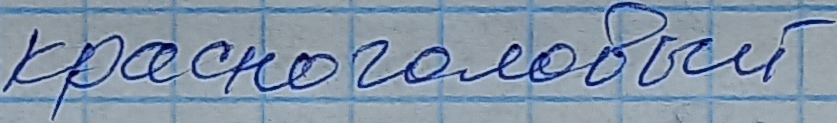красноголовый
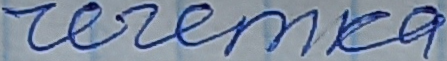чечетка
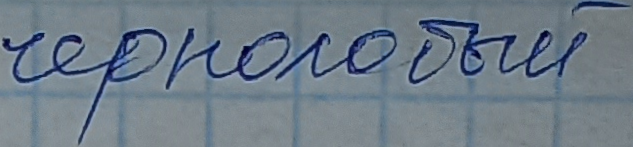чернолобый
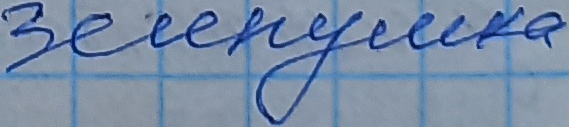зеленушка
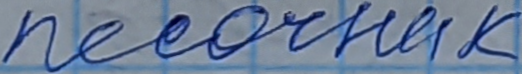песочник
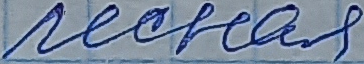лесная
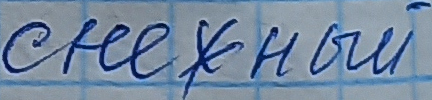снежный
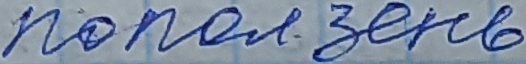поползень
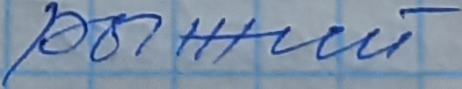рыжий
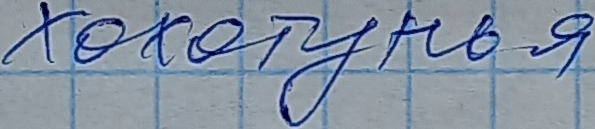хохотунья
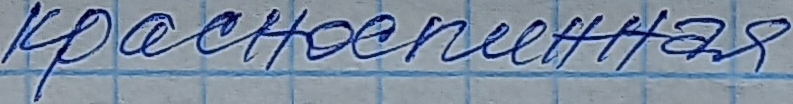красноспинная
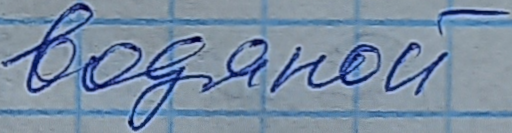водяной
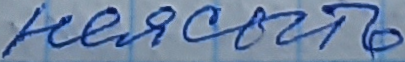неясыть
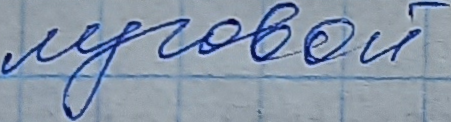луговой
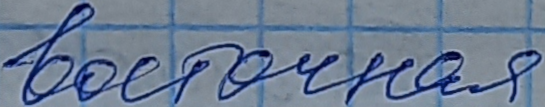восточная
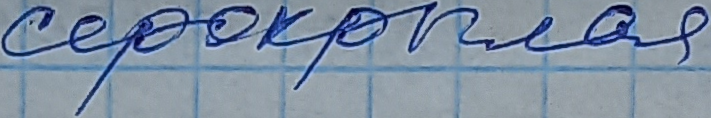серокрылая
